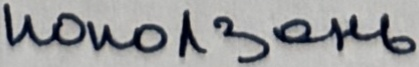поползень
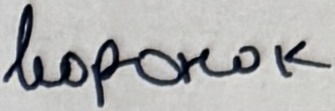воронок
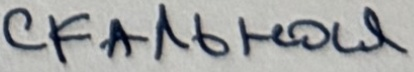скальная
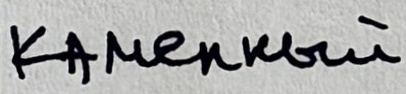каменный
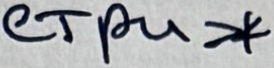стриж
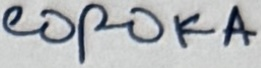сорока
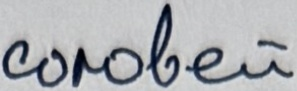соловей
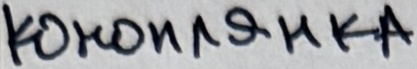коноплянка
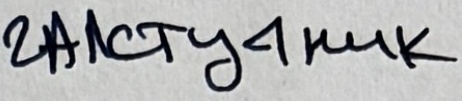галстучник
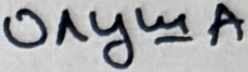олуша
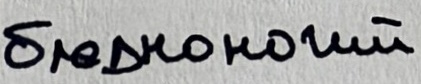бледноногий
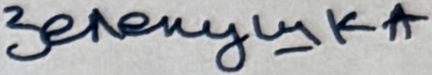зеленушка
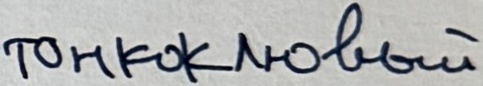тонкоклювый
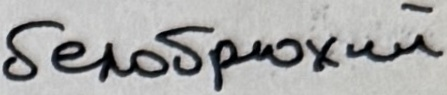белобрюхий
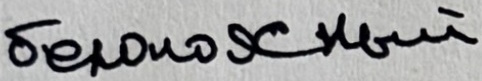белопоясный
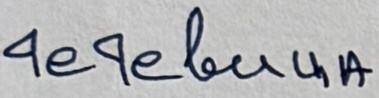чечевица
